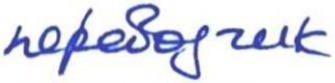перевозчик
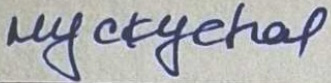мускусная
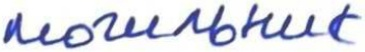могильник
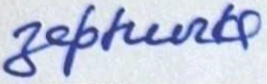зерничка
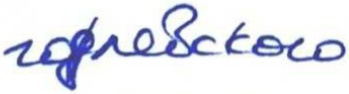годлевского
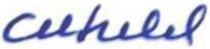синяя
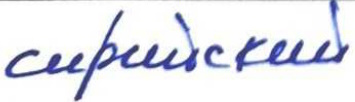сирийский
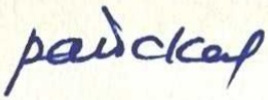райская
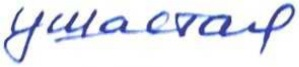ушастая
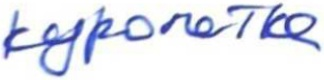куропотка
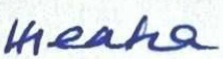желна
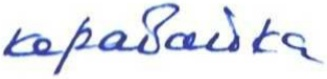каравайка
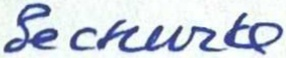весничка
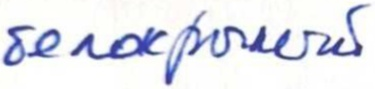белокрылый
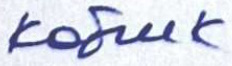кобчик
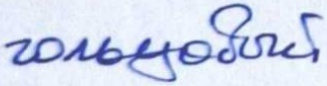гольцовый
